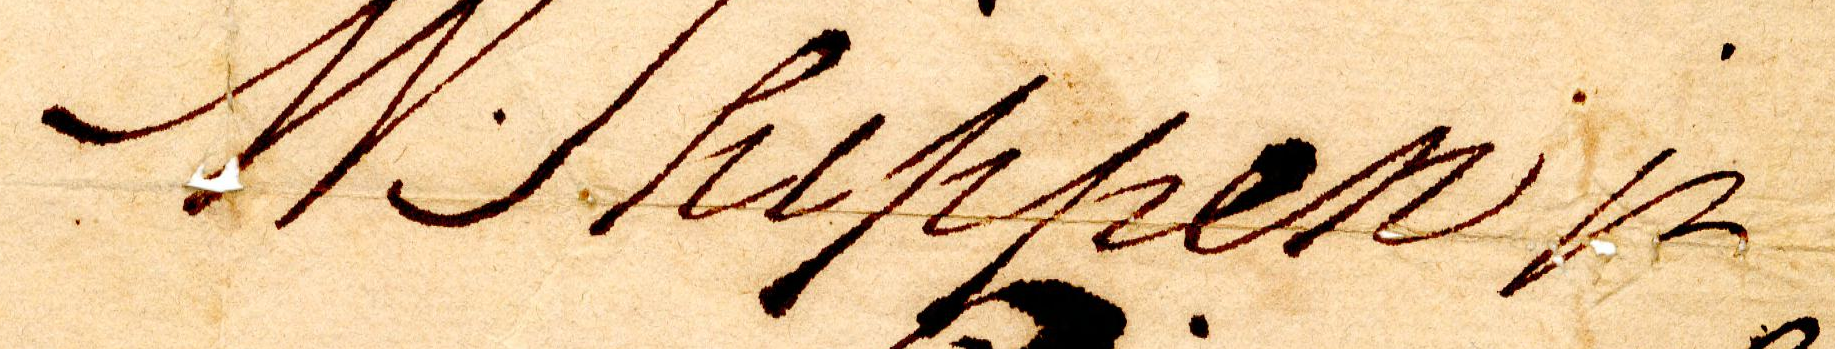W. Shippen jr
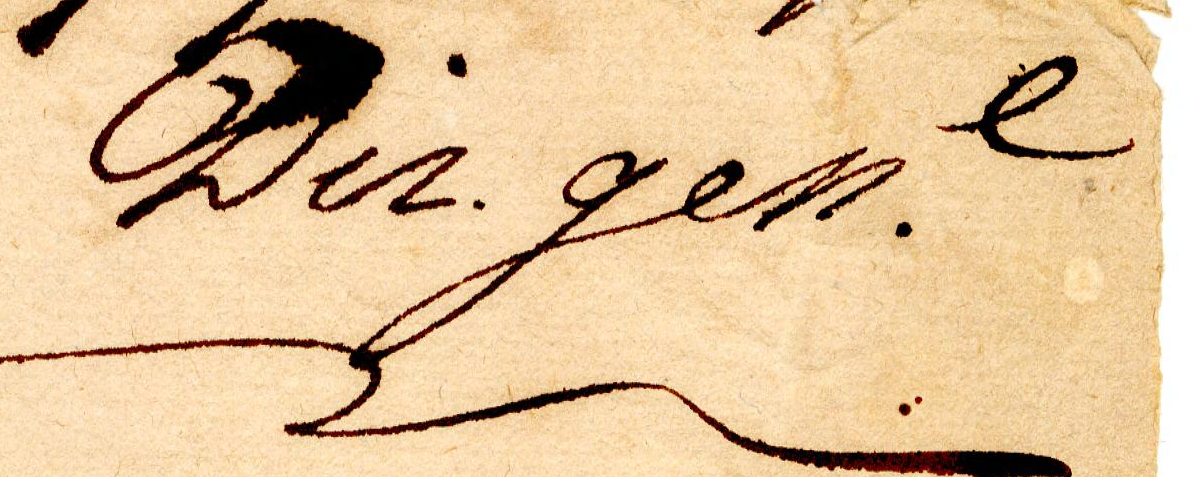Dir. gen^l.
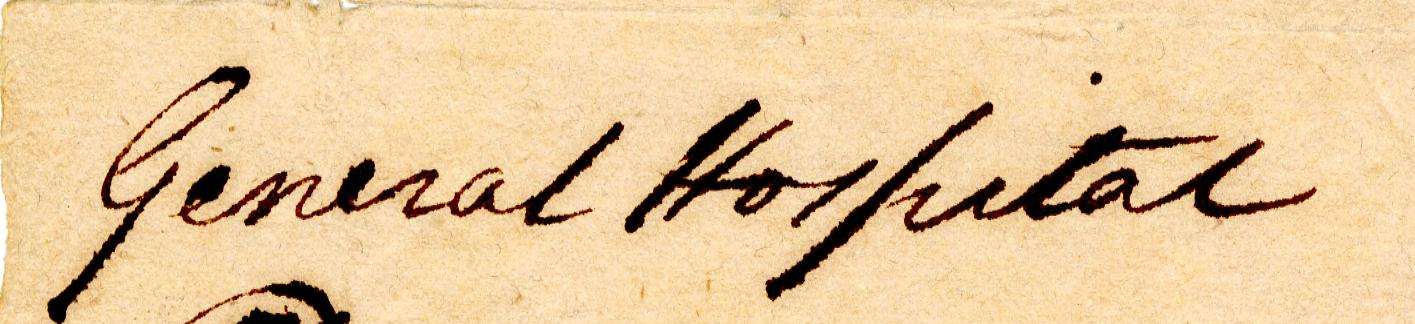General Hospital
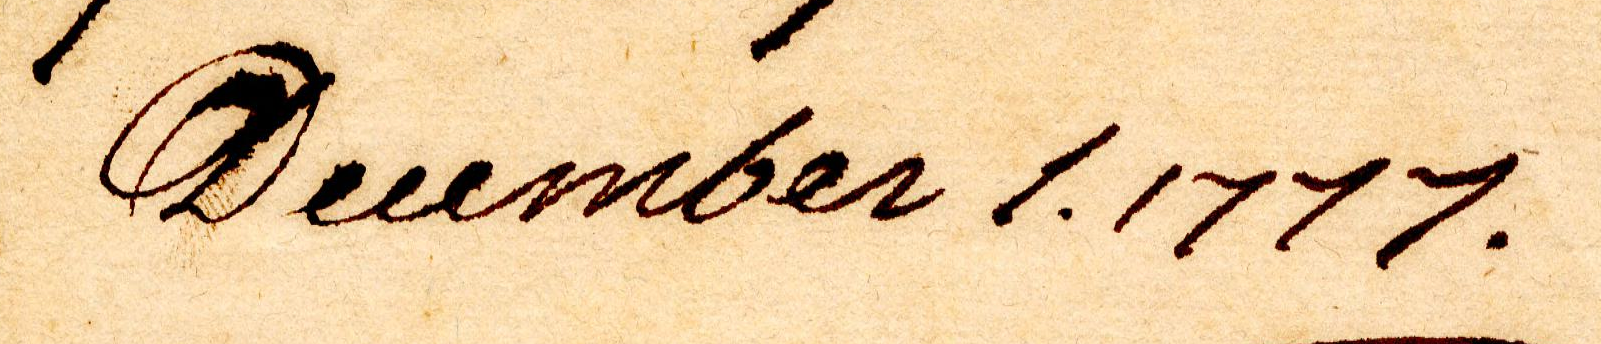December 1. 1777.
